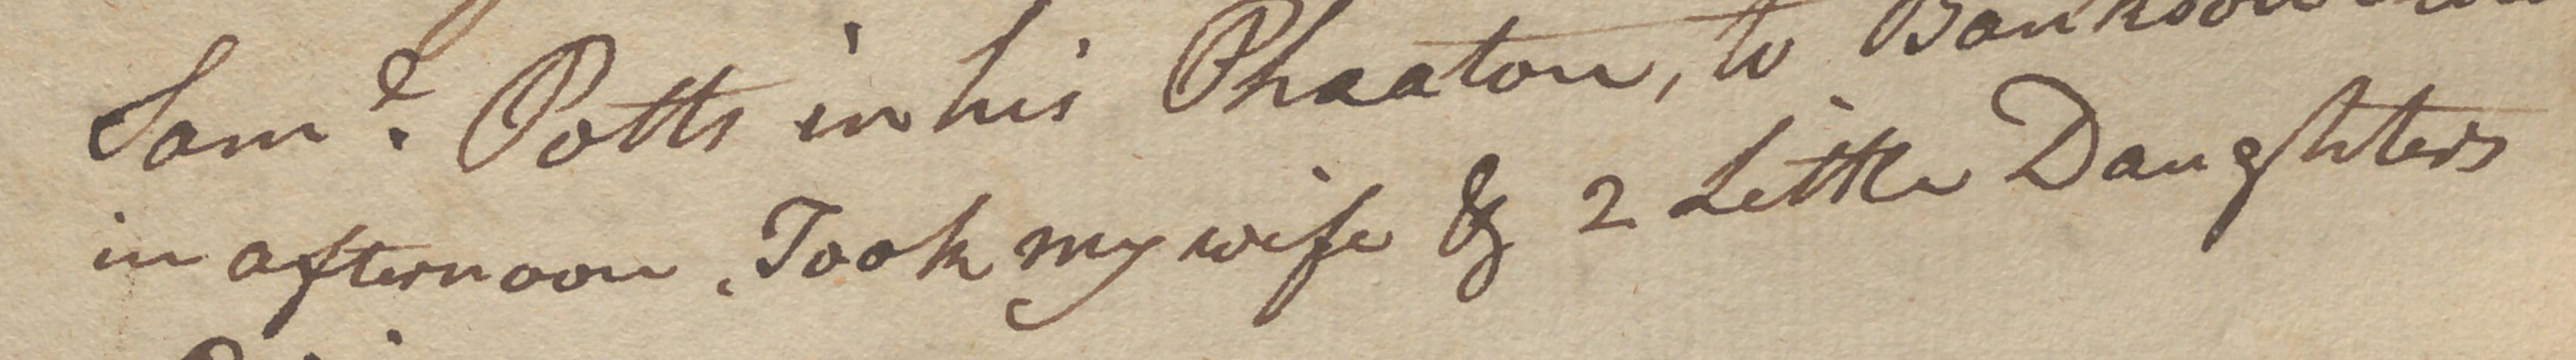in afternoon Took my wife & 2 Little Daughters
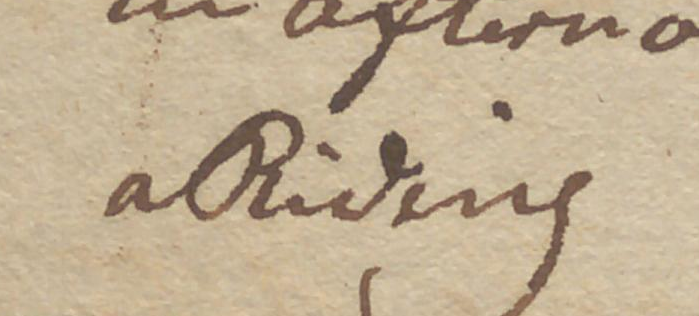a Riding
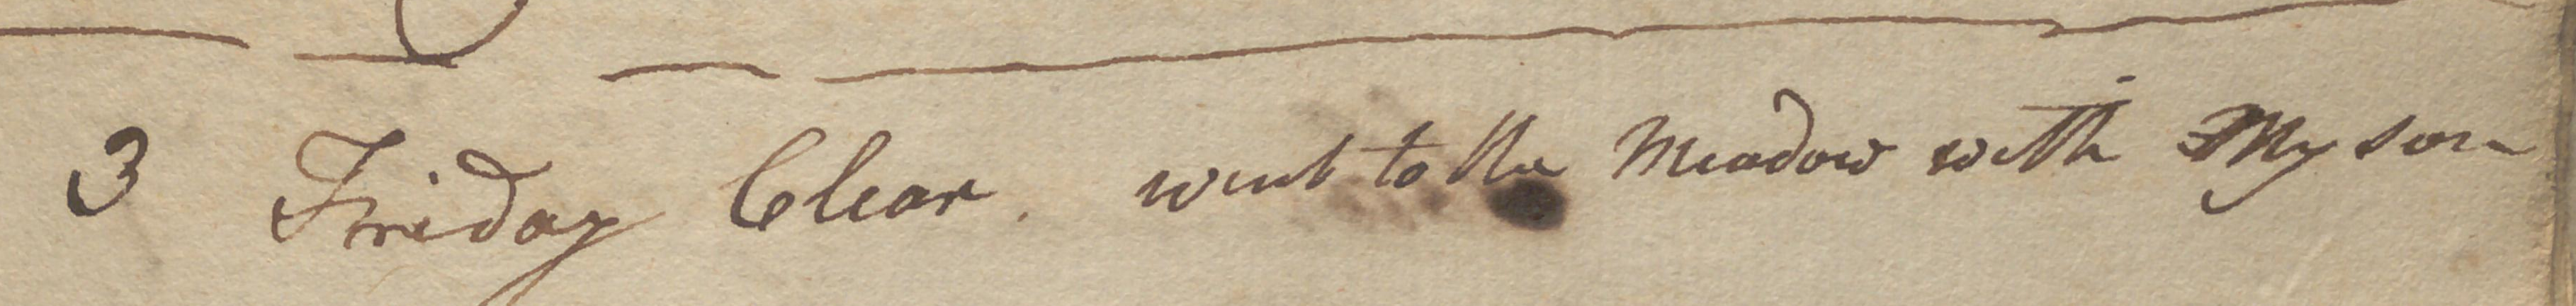3 Friday Clear. went to the Meadow with My son
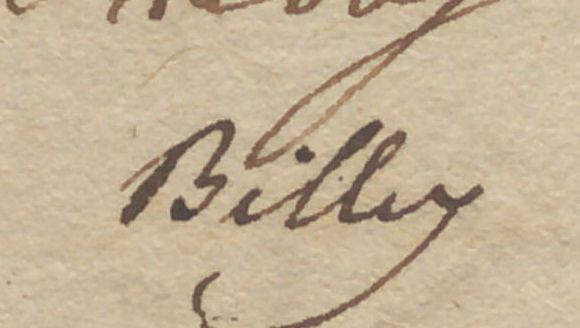Billey
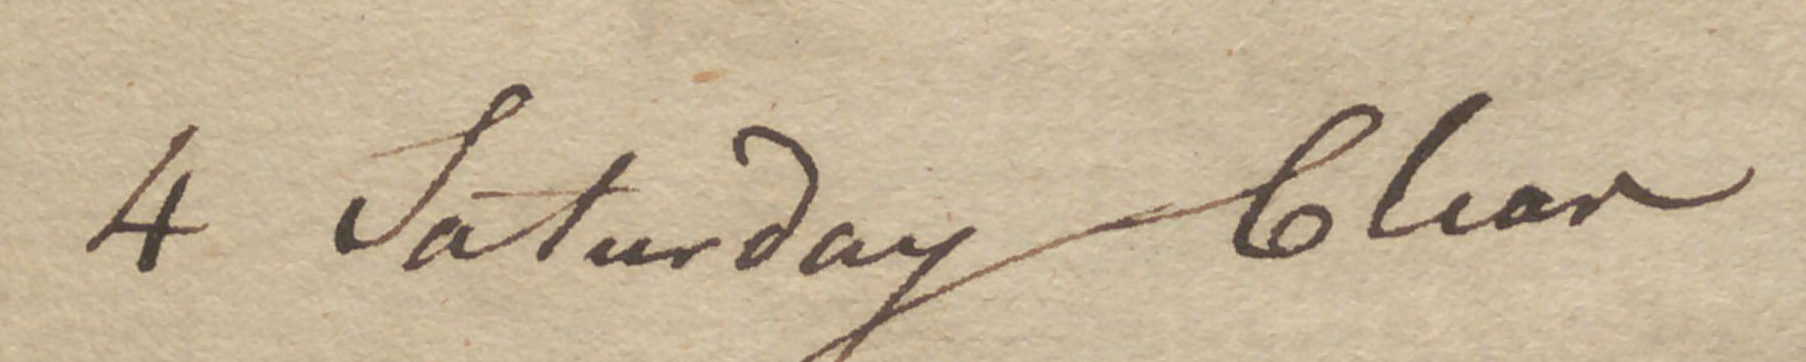4 Saturday Clear
